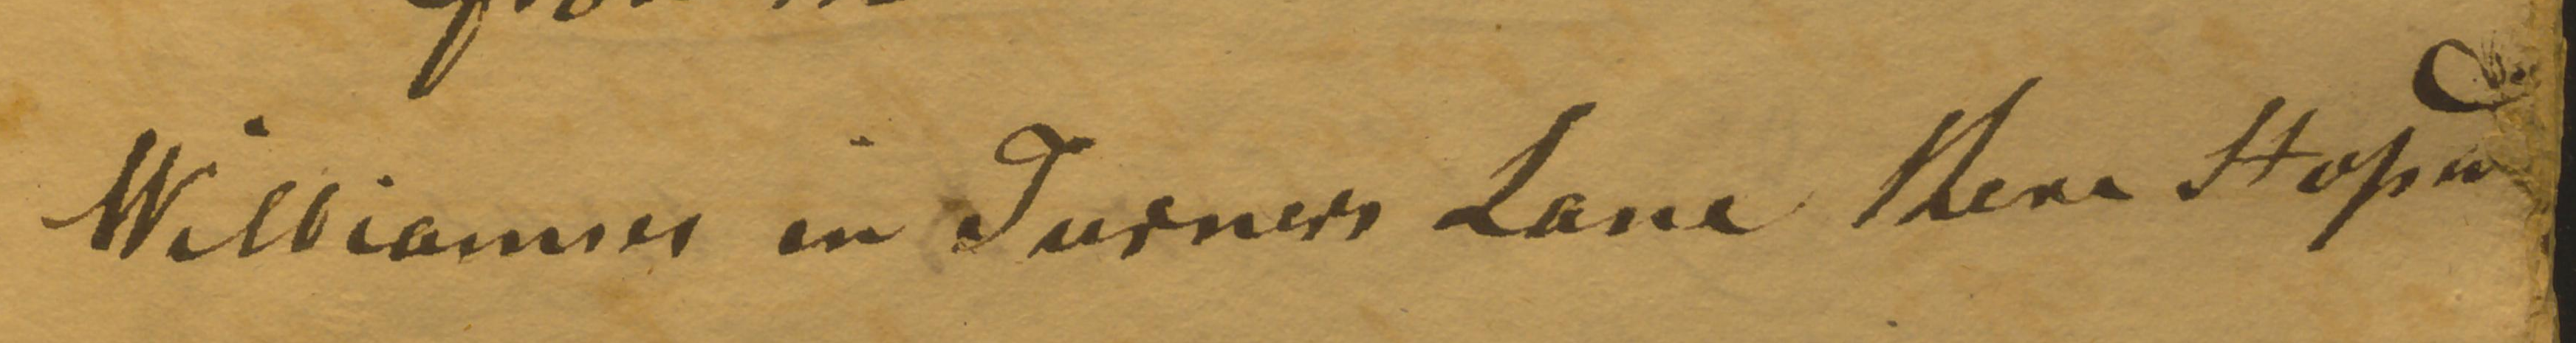Williamses in Turners Lane there Stoped
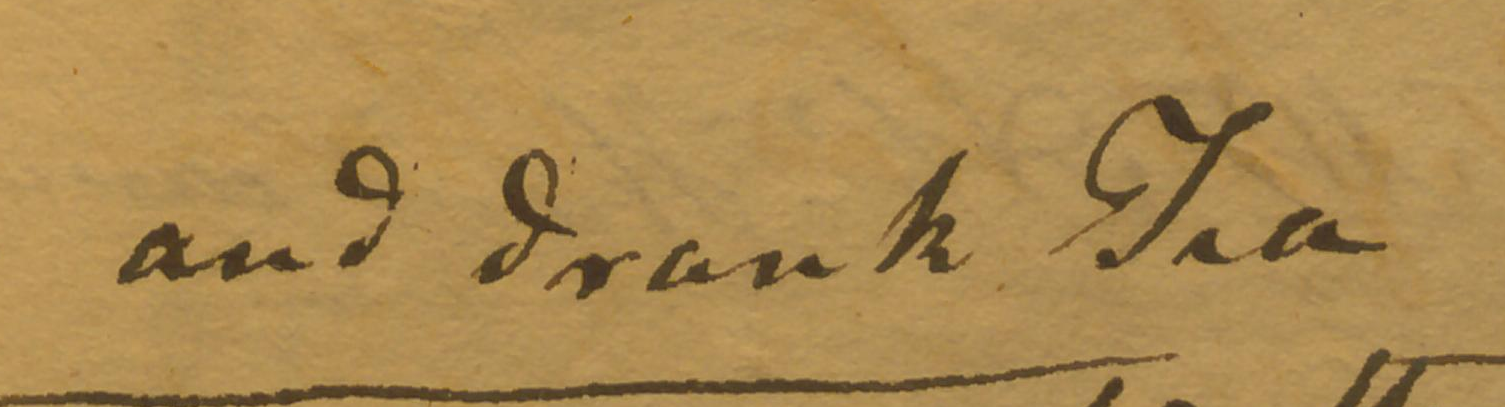and drank Tea
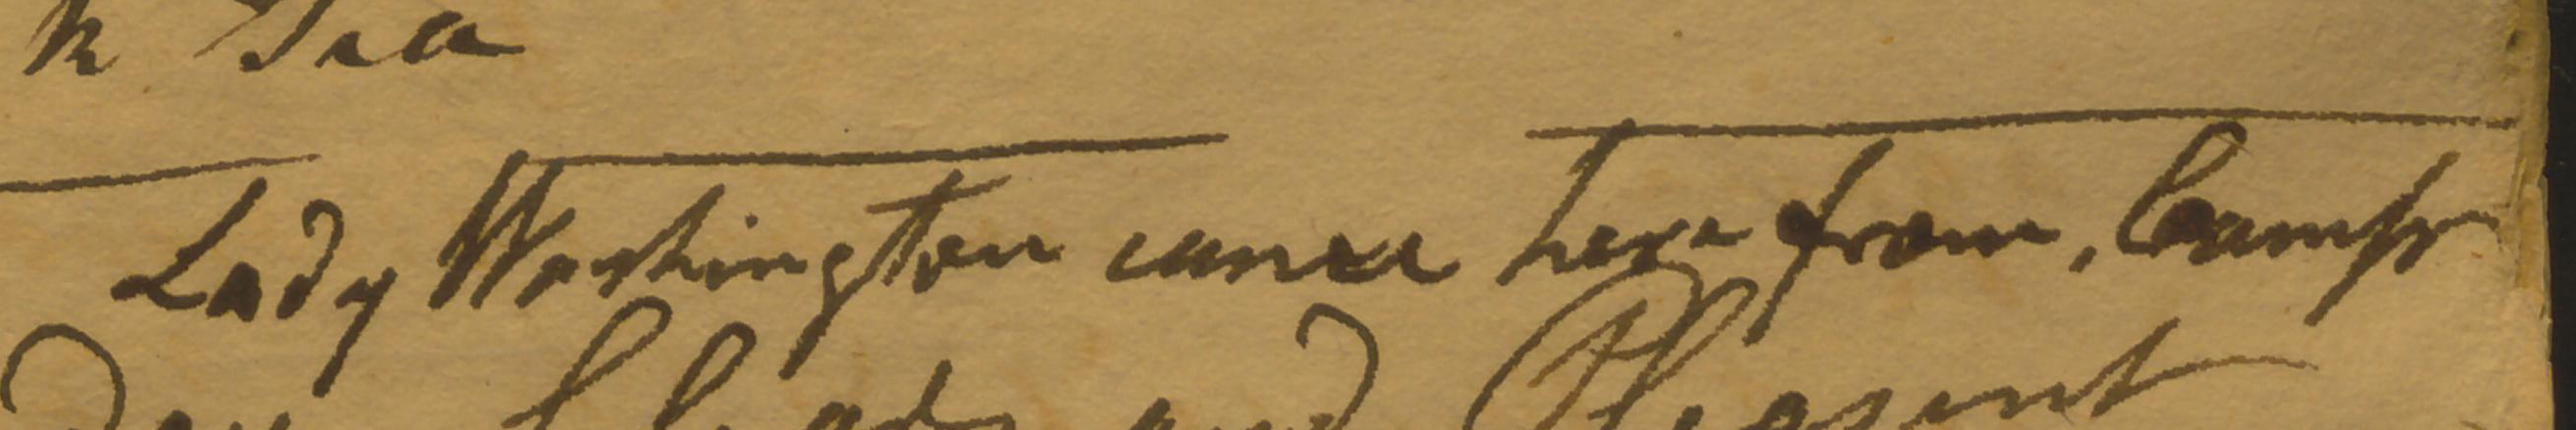Lady Washington came here from Camp
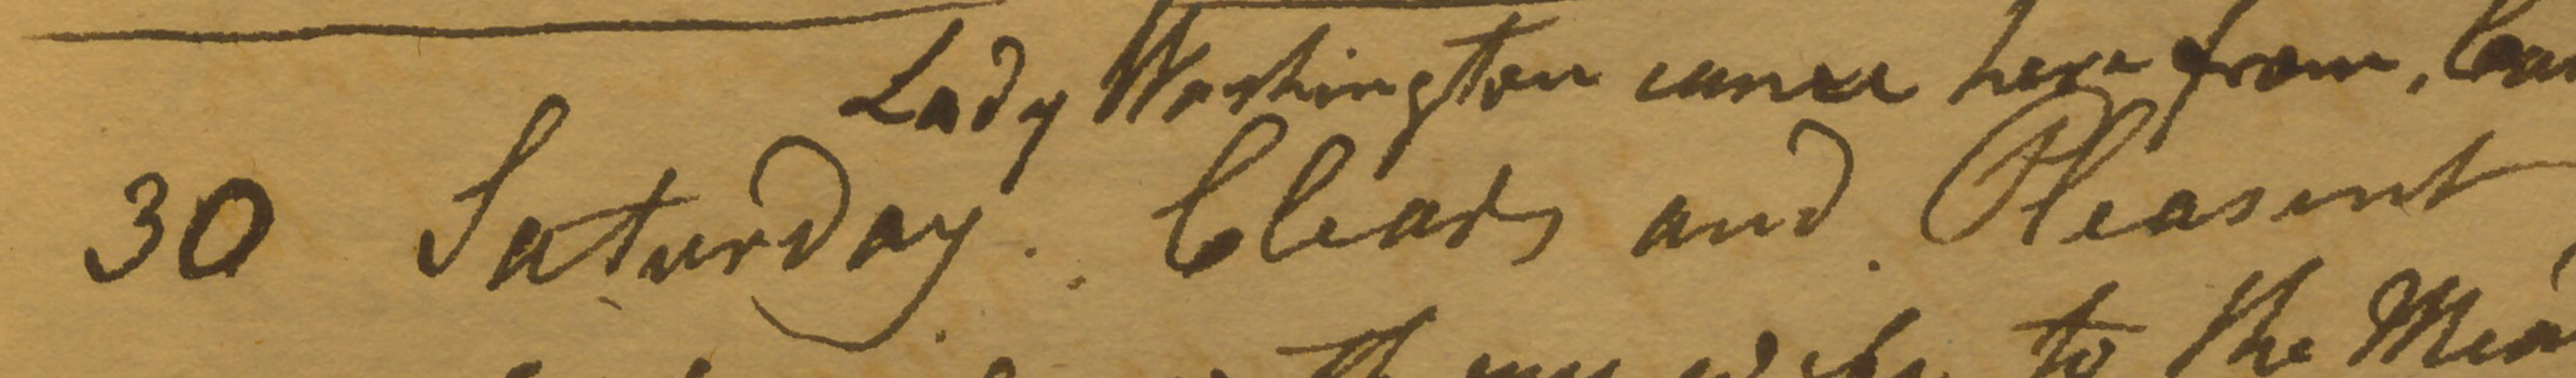31 Saturday. Clear and Pleasent
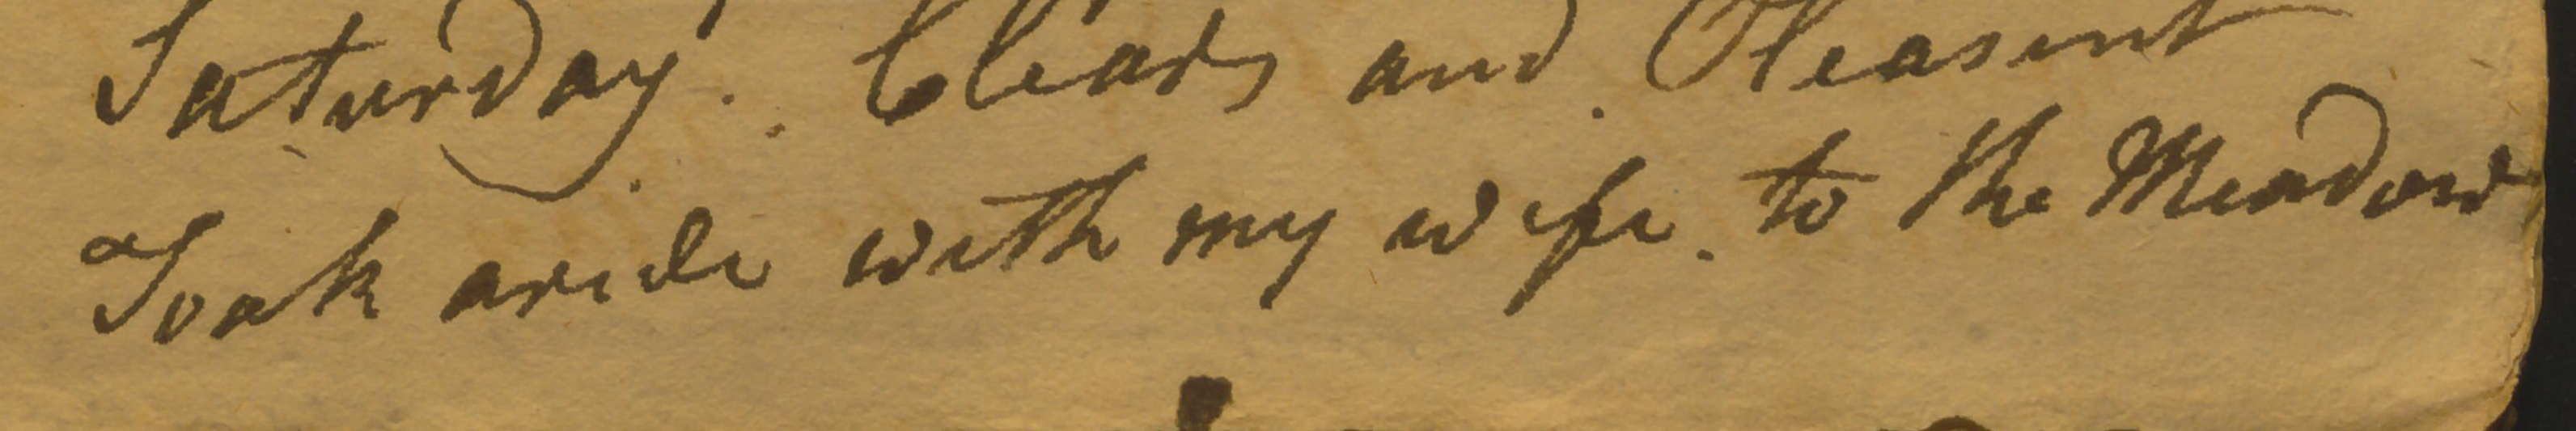Took a ride with my wife to the Meadow
